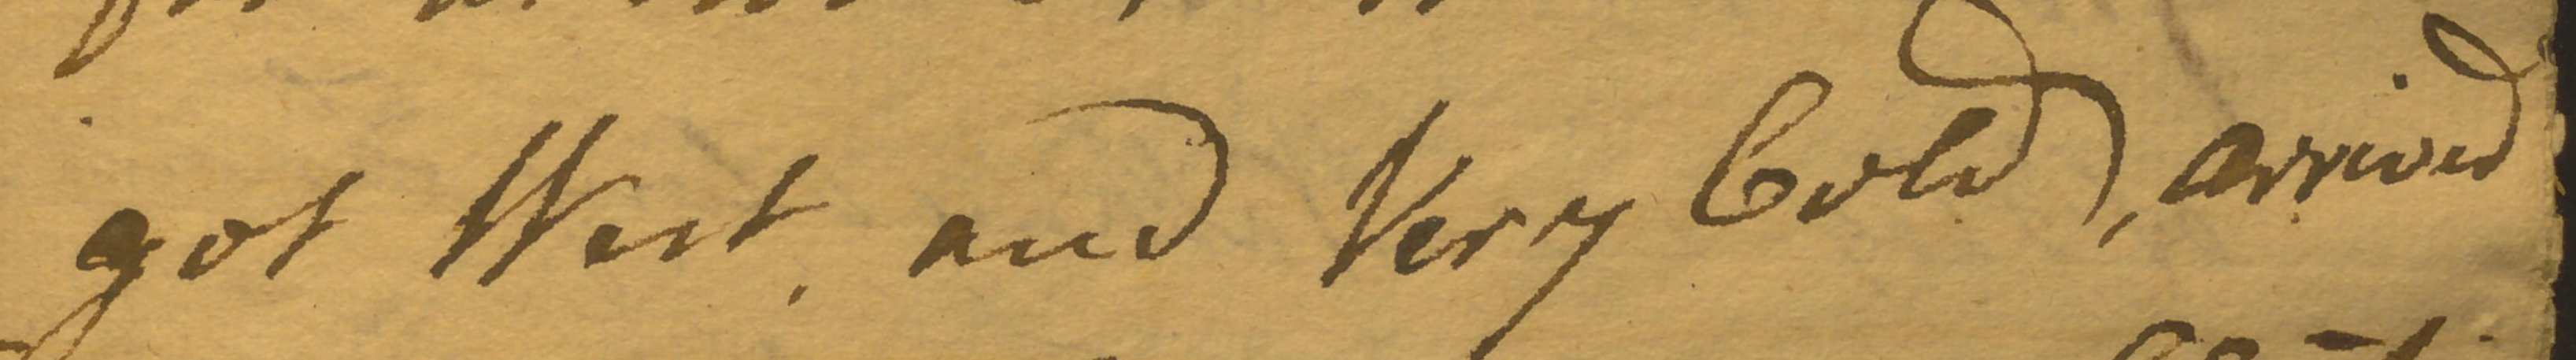got West and Very Cold arrived
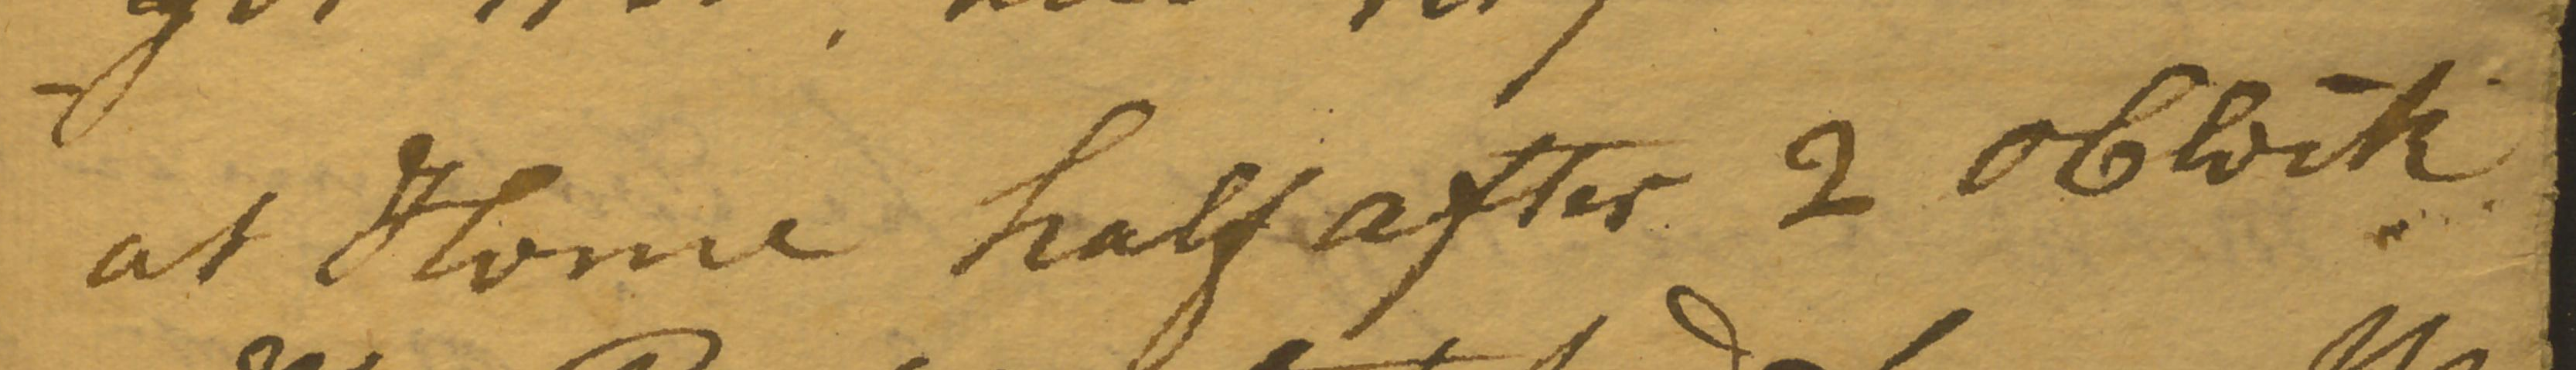at Home half after 2 oClock
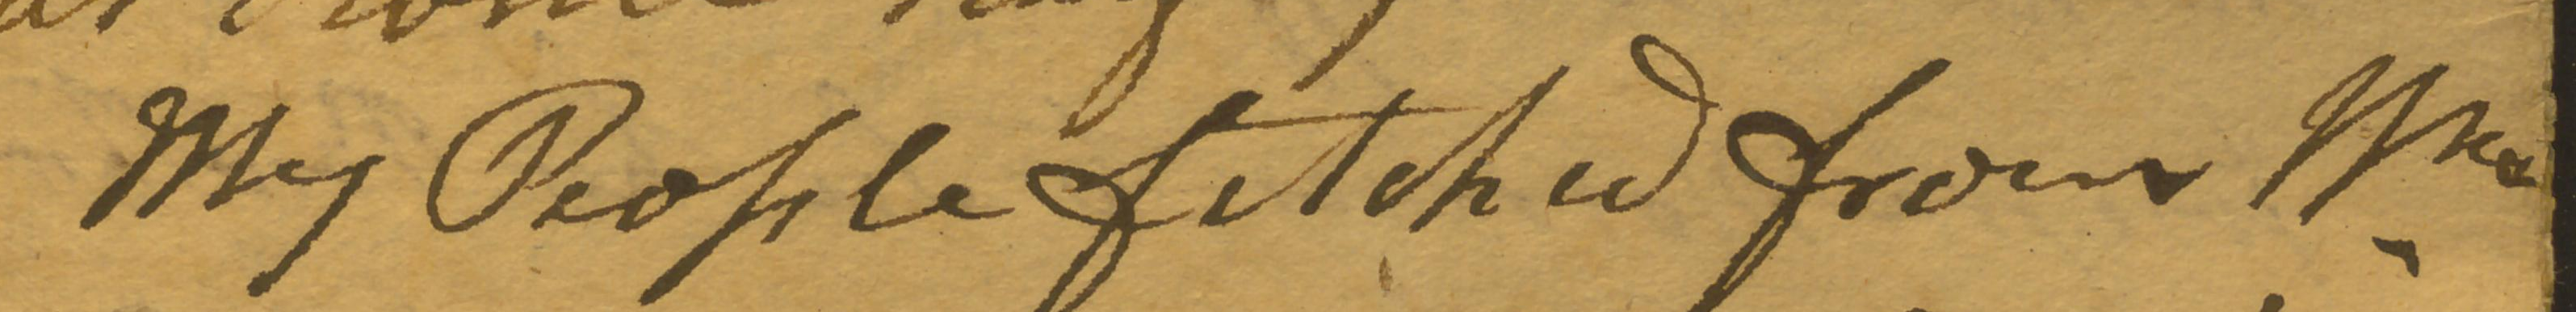My People fetched from M^r
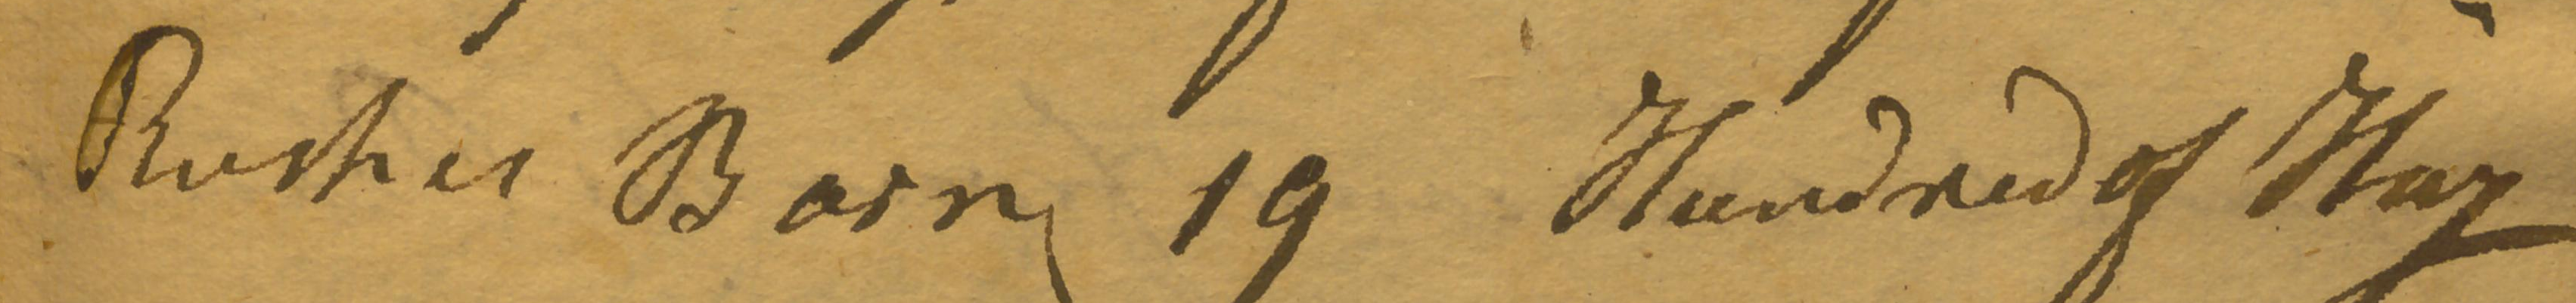Rushes Barn 19 Hundred of Hay
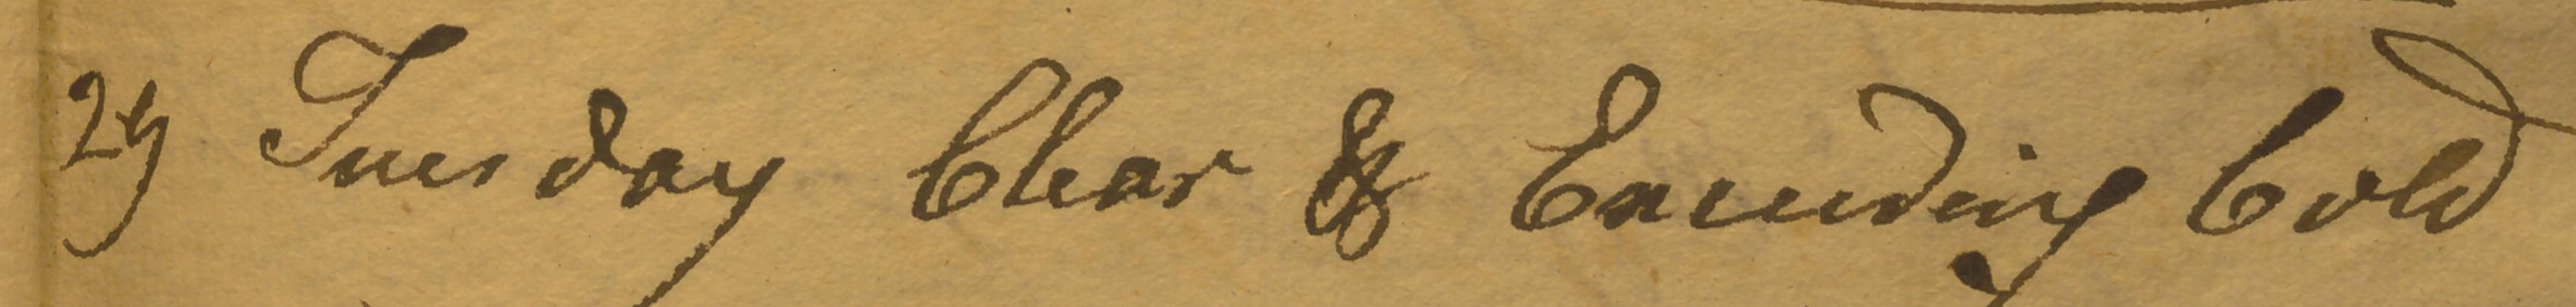29 Tuesday Clear & Exceeding Cold
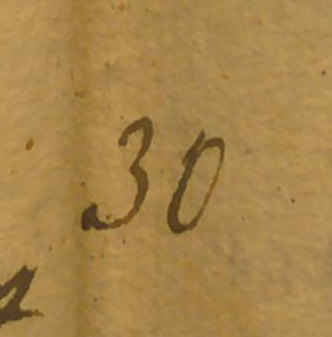30
